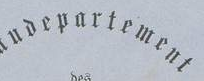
Baudepartement
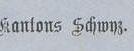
Kantons Schwyz.
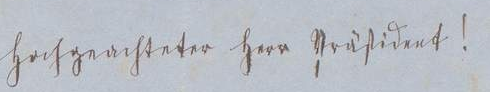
Hochgeachteter Herr Präsident!
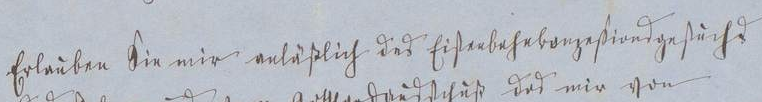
Erlauben Sie mir anläßlich des EisenbahnConzeßionsgesuchs
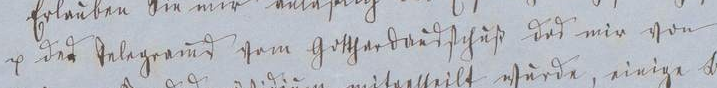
& des Telegramms vom Gotthardausschuß das mir von
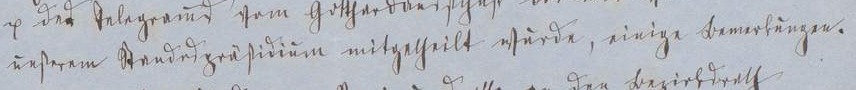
unserem Standespräsidium mitgetheilt wurde, einige Bemerkungen.
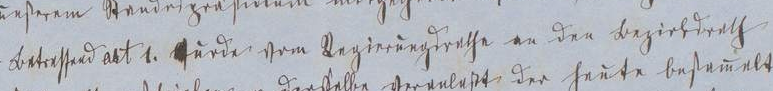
Betreffend art 1. wurde vom Regierungsrathe an den Bezirksrath
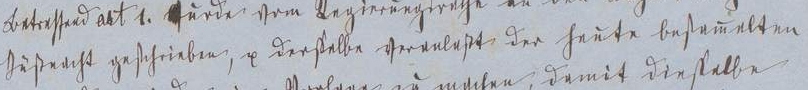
Küßnacht geschrieben, & derselbe veranlaßt der heute besammelten
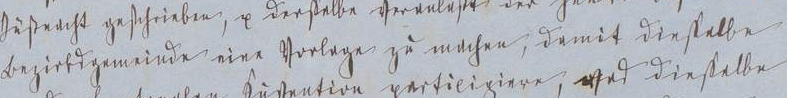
Bezirksgemeinde eine Vorlage zu machen, damit dieselbe
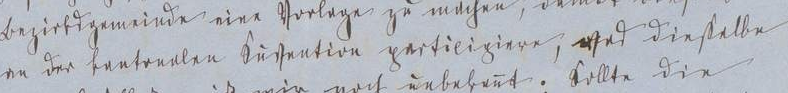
an der kantonalen Subvention participire, was dieselbe
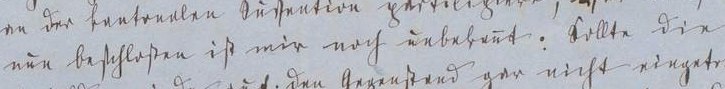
nun beschloßen ist mir noch unbekannt. Sollte die
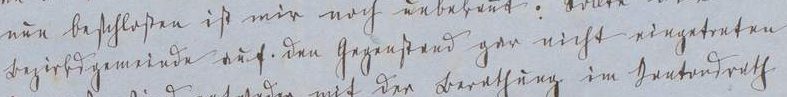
Bezirksgemeinde auf den Gegenstand gar nicht eingetreten
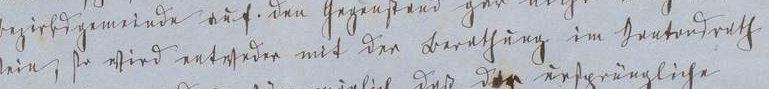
sein, so wird entweder mit der Berathung im Kantonsrath
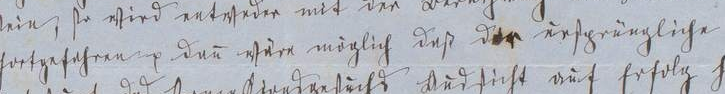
fortgefahren & dann wäre möglich daß der ursprüngliche
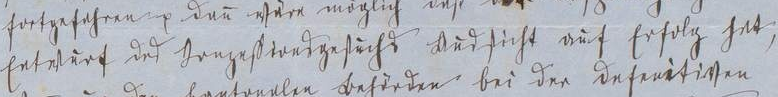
Entwurf des Konzeßionsgesuchs Aussicht auf Erfolg hat,
